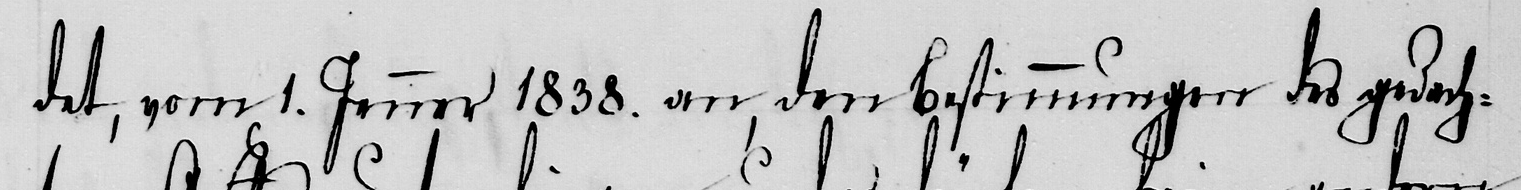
det, vom 1. Jenner 1838. an, den Bestimmungen des gedach¬
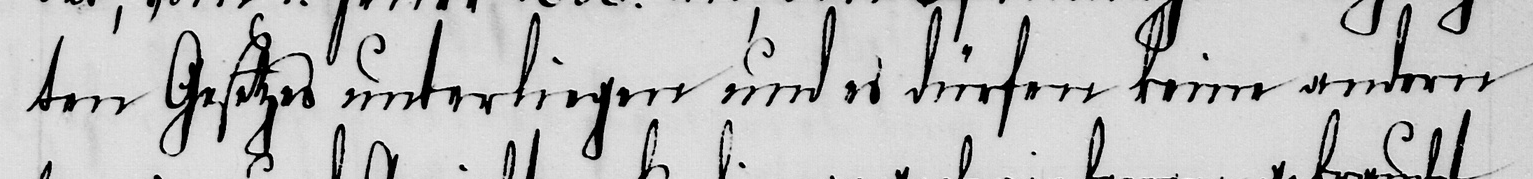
ten Gesetzes unterliegen und es dürfen keine andern
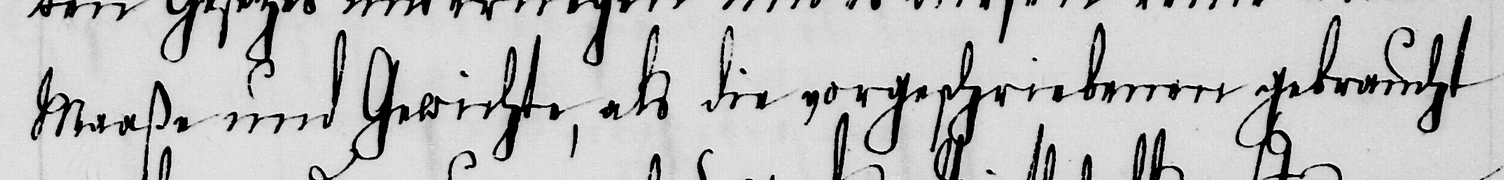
Maaße und Gewichte, als die vorgeschriebenen gebraucht
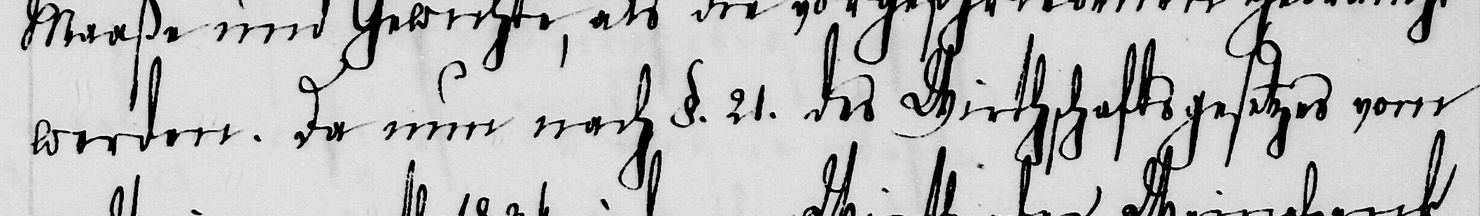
werden. Da nun nach §. 21. des Wirthschaftsgesetzes vom
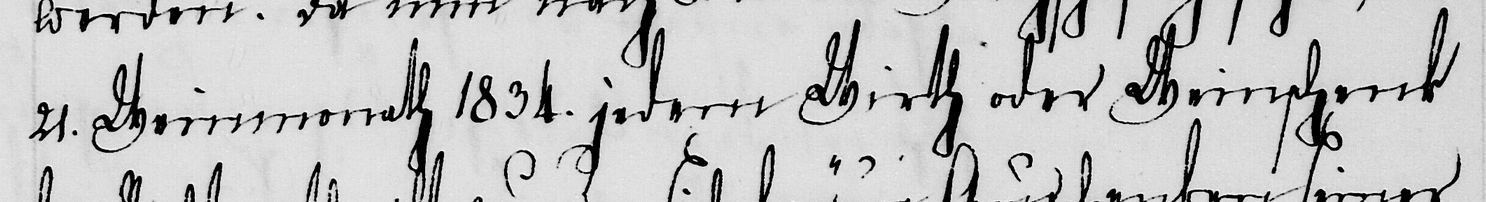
21. Weinmonath 1834. jedem Wirth oder Weinschenk
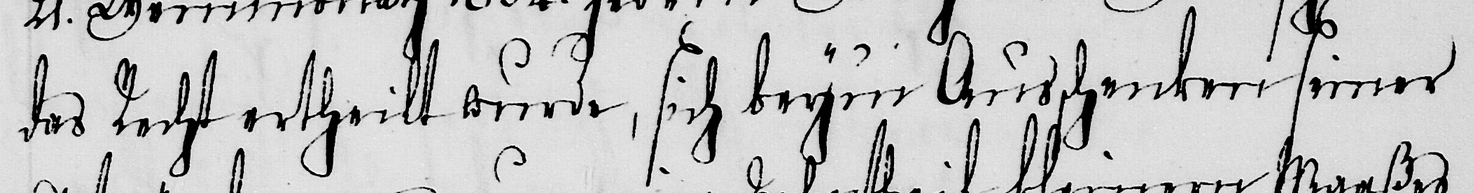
das Recht ertheilt wurde, sich beym Ausschenken seiner
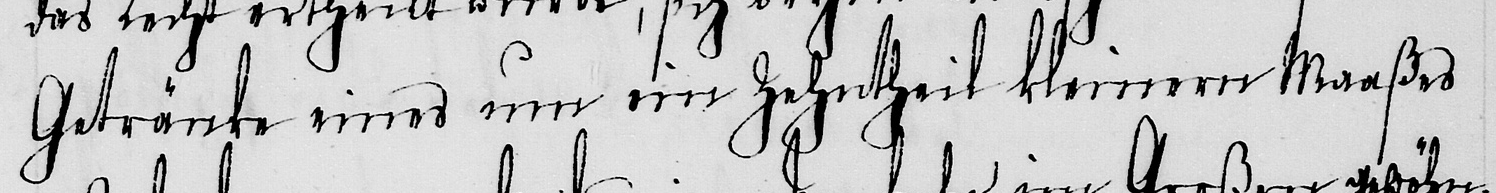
Getränke eines um ein Zehntheil kleinern Maaßes
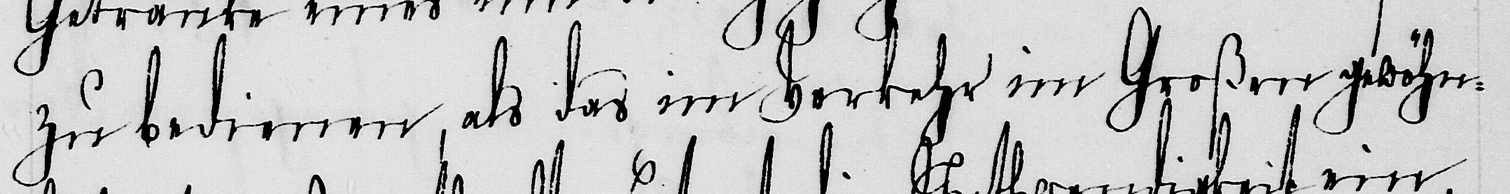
zu bedienen, als das im Verkehr im Großen gewöhn¬
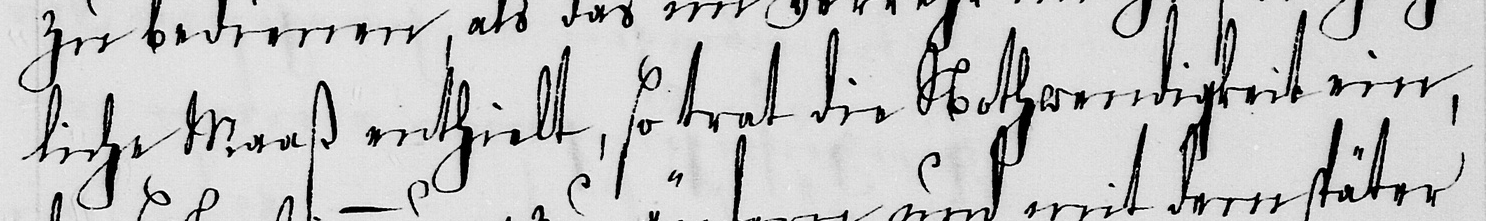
liche Maaß enthielt, so trat die Nothwendigkeit ein,
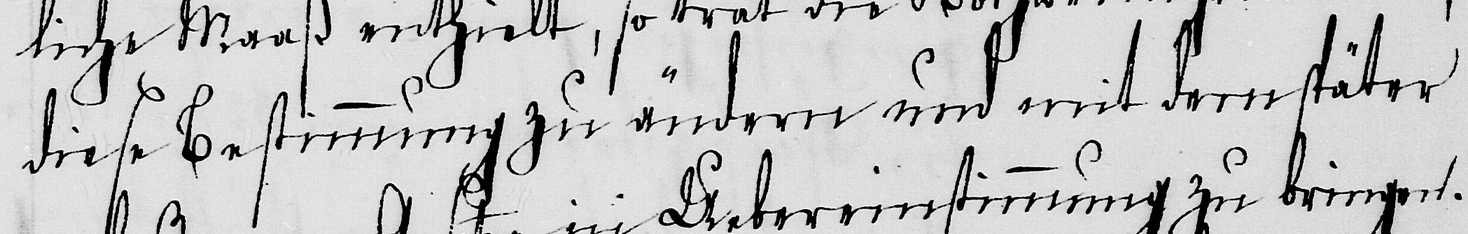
diese Bestimmung zu ändern und mit dem später
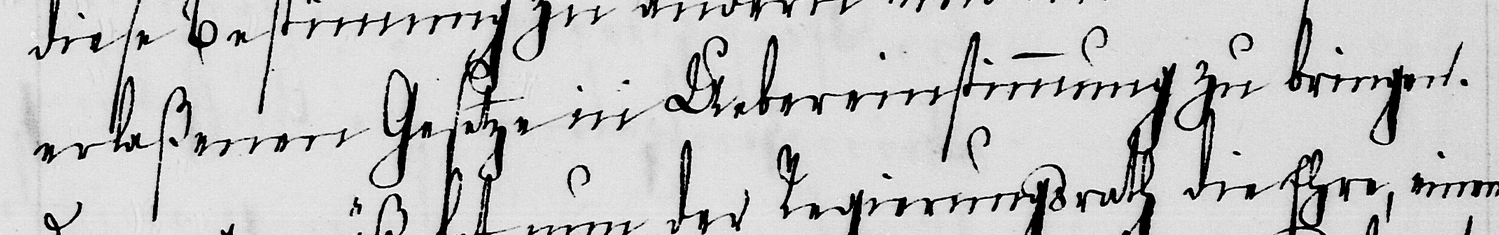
erlaßenen Gesetze in Uebereinstimmung zu bringen.
